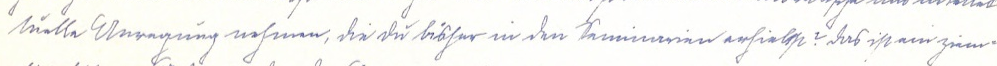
tuelle Anregungen mehren, die du bisher in den Seminarien erhiltst? Das ist ein ziem-
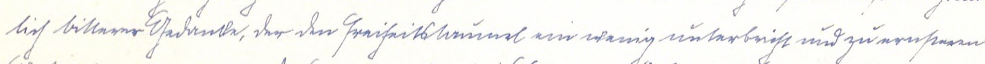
lich bitterer Gedanke, der den Freiheitsbaumel ein wenig unterbricht und zu ernsteren
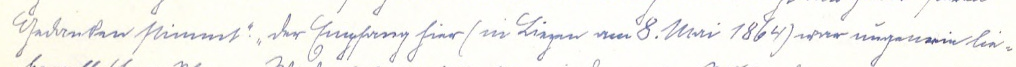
Gedanken stimmt." "Der Empfang hier 8in Liezen am 8. Mail 1864) war ungemein lie-
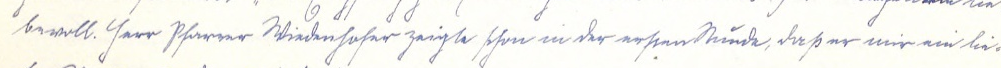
bevoll. Herr Pfarrer Wiedenhofer zeigte schon in der ersten Stunde, daß er mir ein lie-
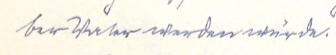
ber Vater werden würde."
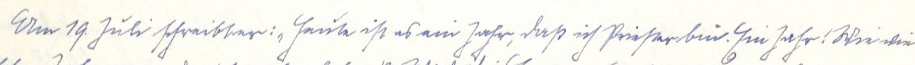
Am 19. Juli schreibt er: "Heute ist es ein Jahr, daß ich Priester bin. Ein Jahr! Wie viel-
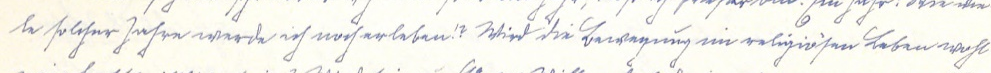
le solcher Jahre werde ich noch erleben!? Wird die Bewegung im religiösen Leben wohl
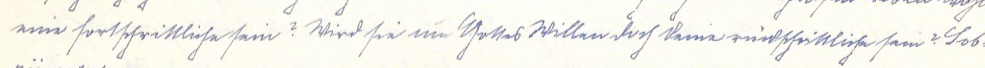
eine fortschrittliche sein? Wird sie in Gottes Willen doch kaum rückschrittlich sein? Sob-
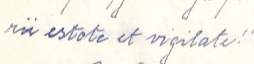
rii estote et vigilate!"
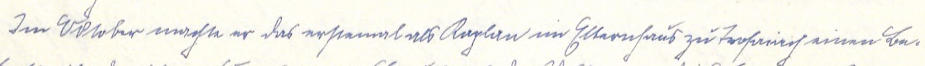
Im Oktober machte er das erstemal als Kaplan im Elternhaus zu Trofaich einen Be-
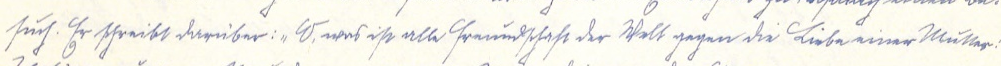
such. Er schreibt darüber: "O, wast ist alle Freundschaft der Welt gegen die Liebe einer Mutter!
